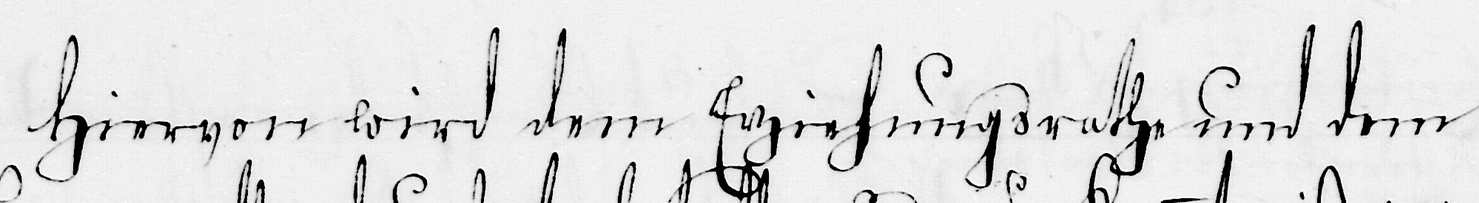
Hiervon wird dem Erziehungsrathe und dem
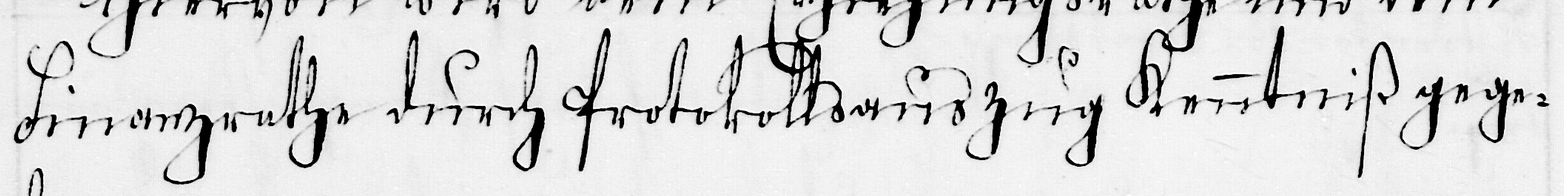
Finanzrathe durch Protokollsauszug Kenntniß gege¬
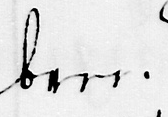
ben.
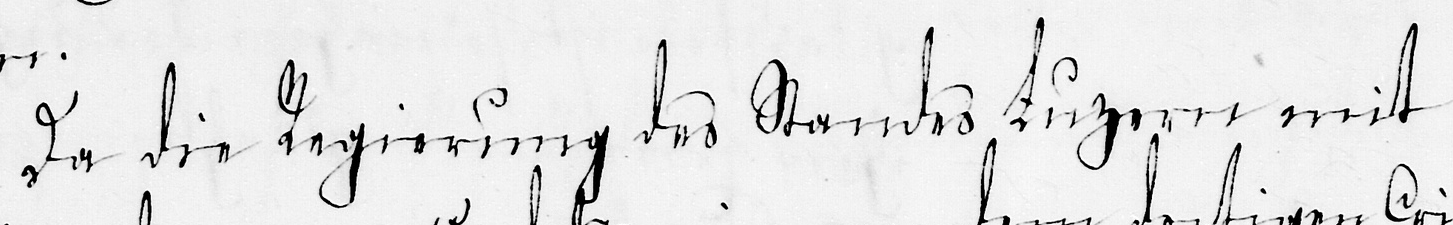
Da die Regierung des Standes Luzern mit
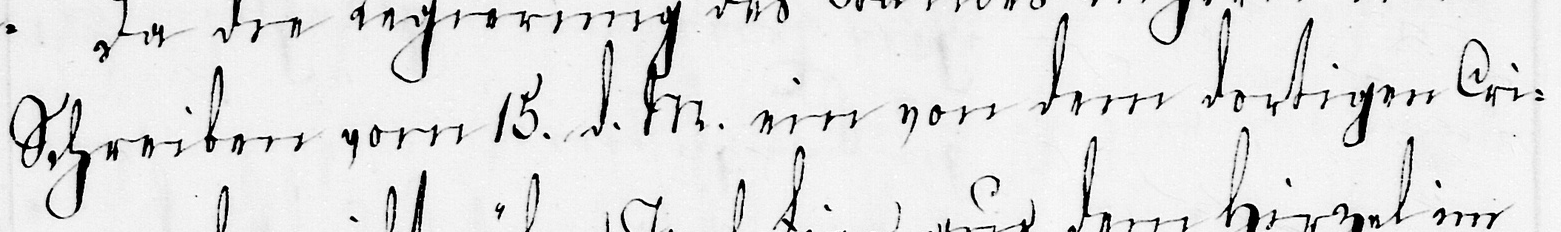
Schreiben vom 15. d. M. ein von dem dortigen Cri¬
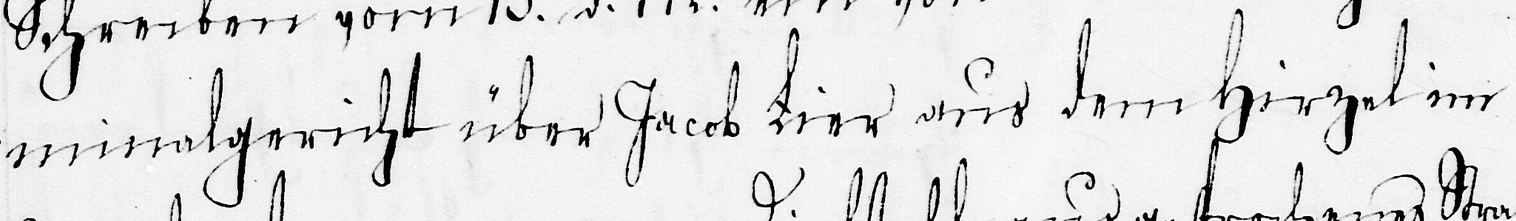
minalgericht über Jacob Lier aus dem Hirzel im
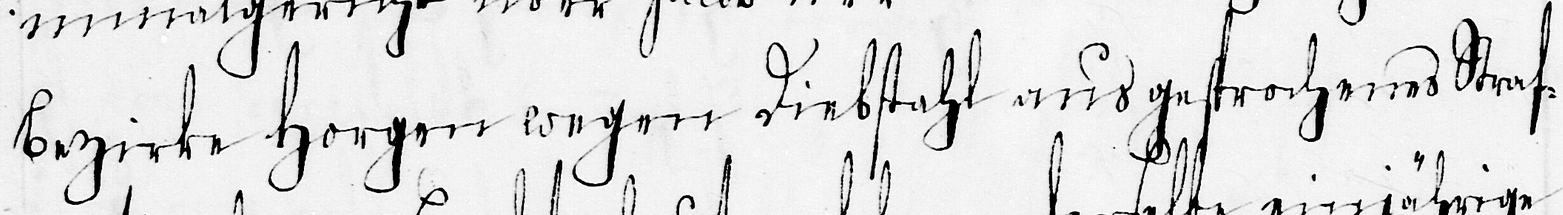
Bezirke Horgen wegen Diebstahl ausgesprochenes Straf¬
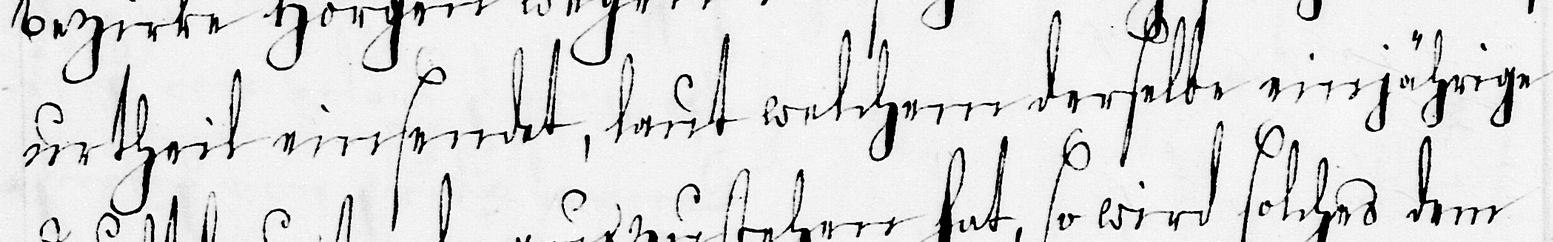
urtheil einsendet, laut welchem derselbe einjährige
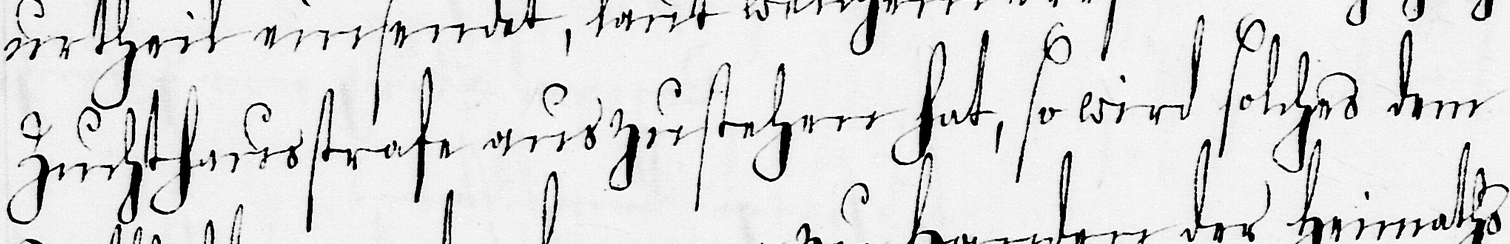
Zuchthausstrafe auszustehen hat, so wird solches dem
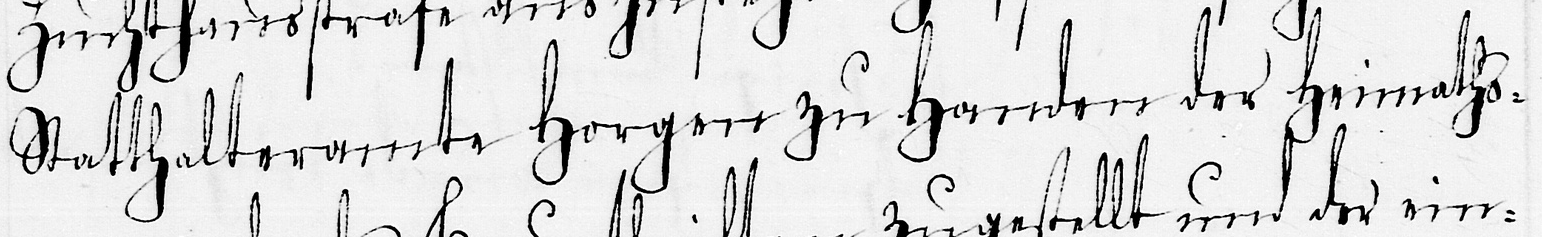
Statthalteramte Horgen zu Handen der Heimaths¬
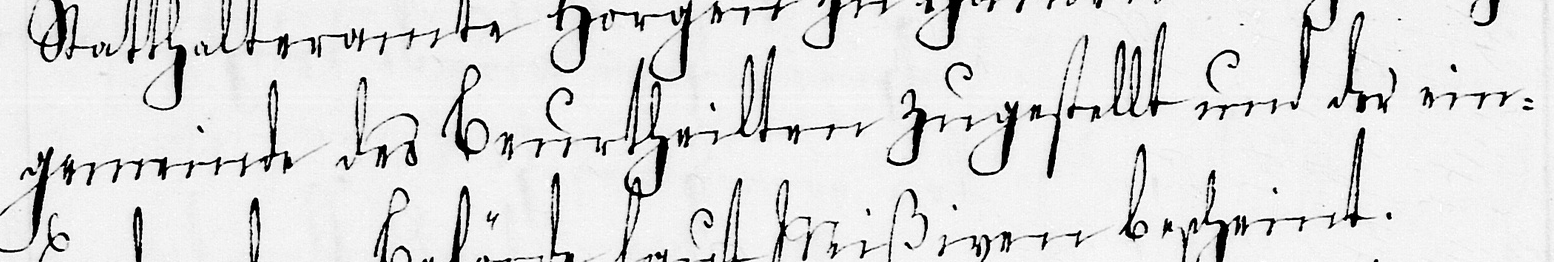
gemeinde des Beurtheilten zugestellt und der ein¬
